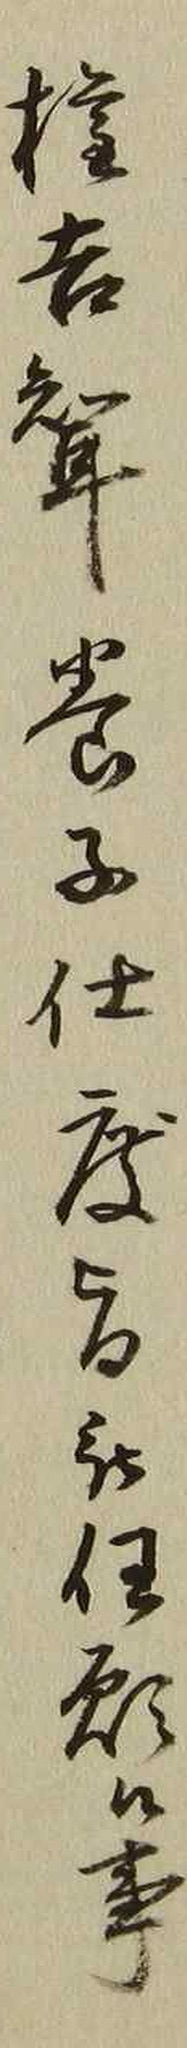権吉婿養子仕度旨被任願候事
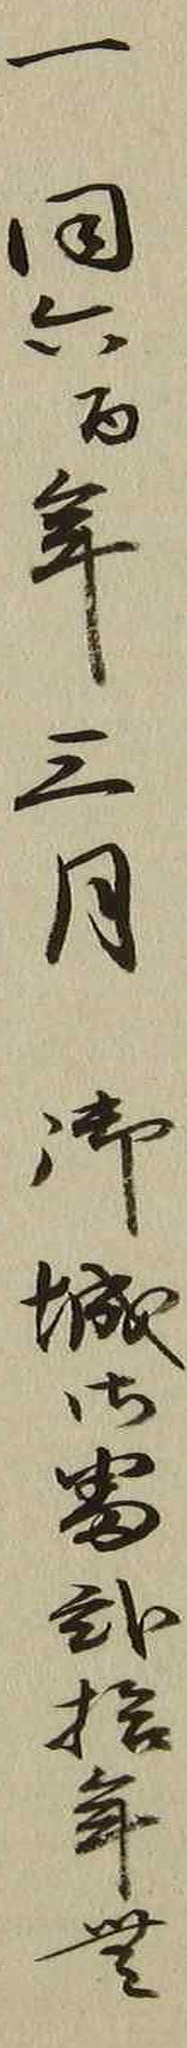一同六酉年三月御城御番弐拾年無
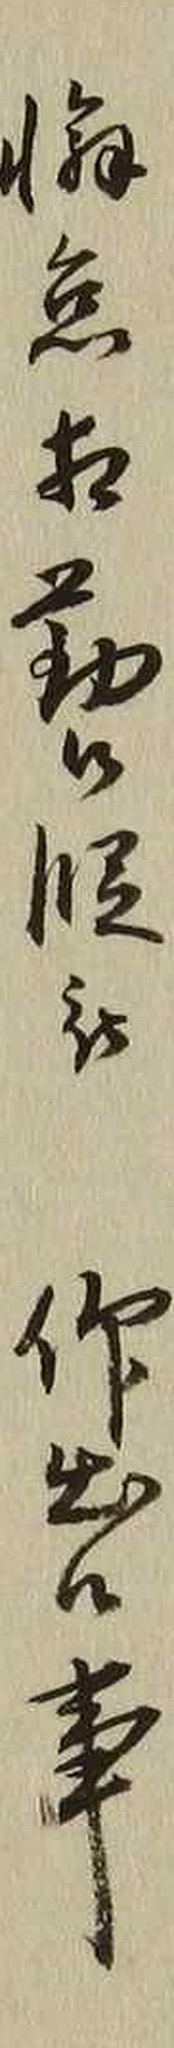懈怠相勤候段被仰出候事
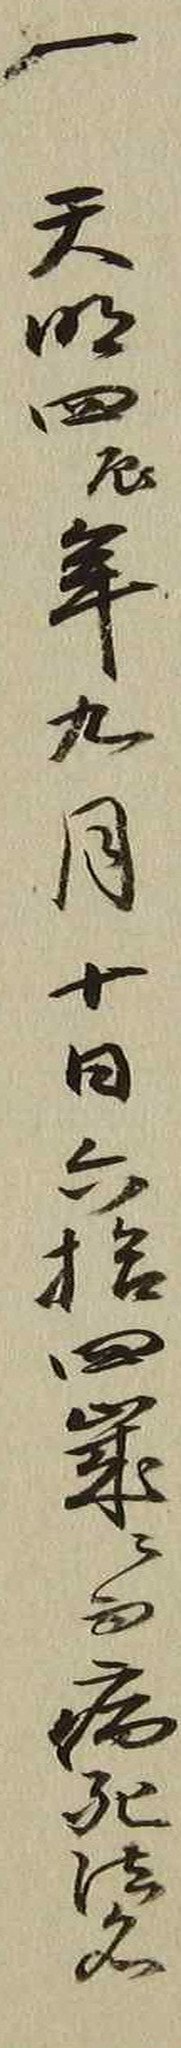一天明四辰年九月十日六拾四歳ニ而病死法名
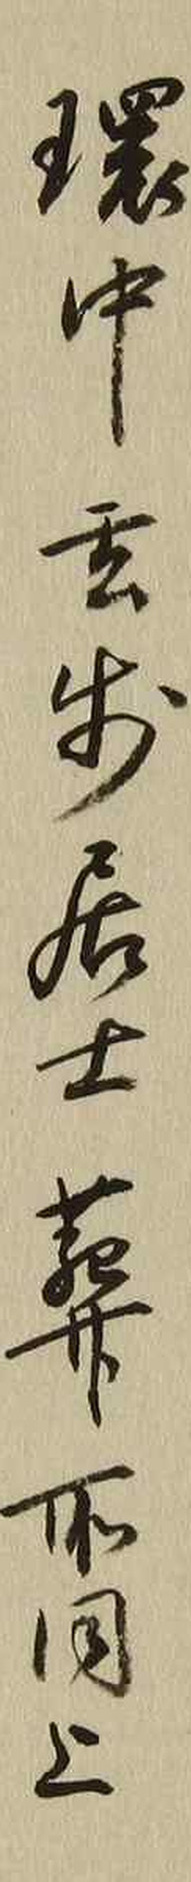環中玄歩居士葬所同上
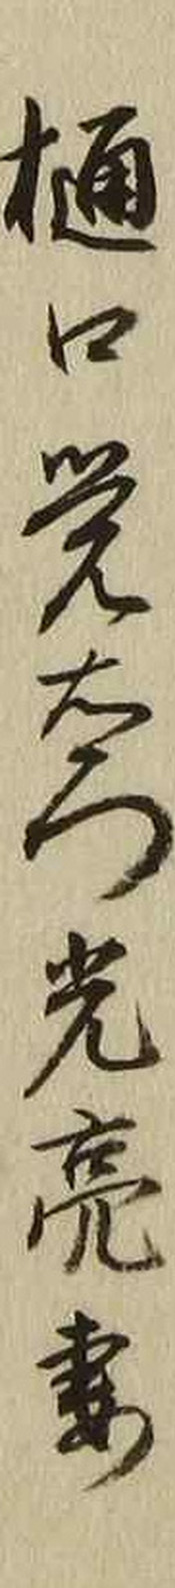樋口覚右衛門光亮妻
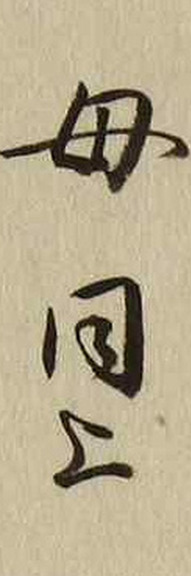母同上
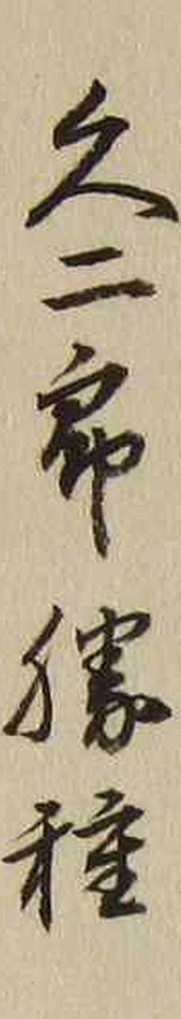久二郎勝種
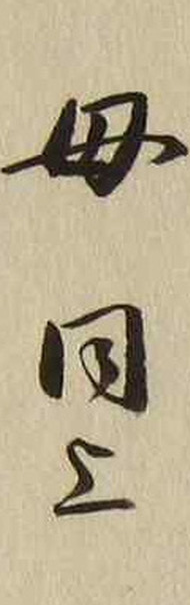母同上

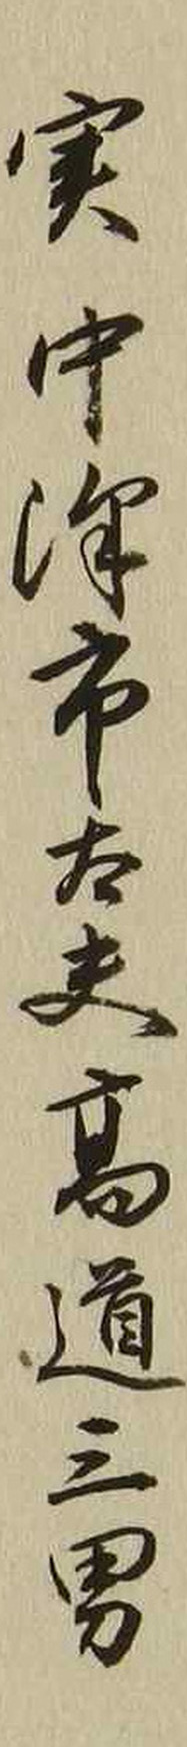実中澤市太夫高道三男
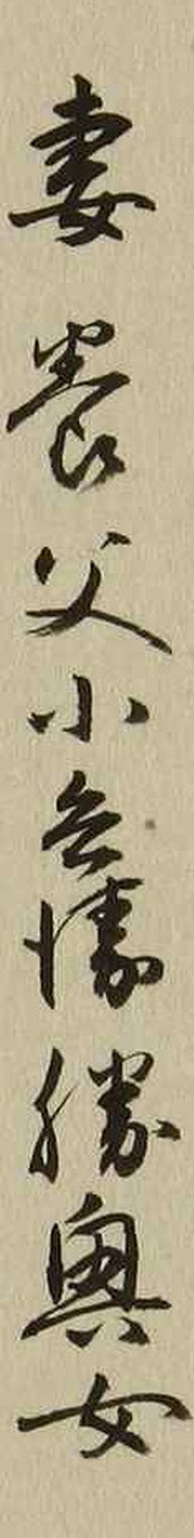妻養父小兵衛勝興女
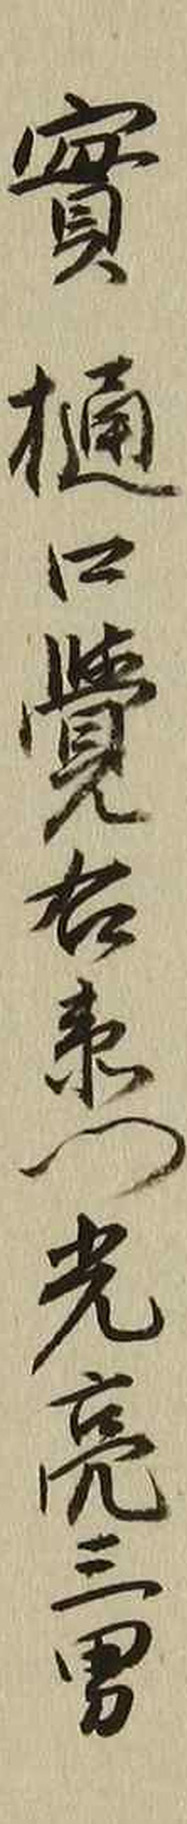実樋口覚右衛門光亮三男
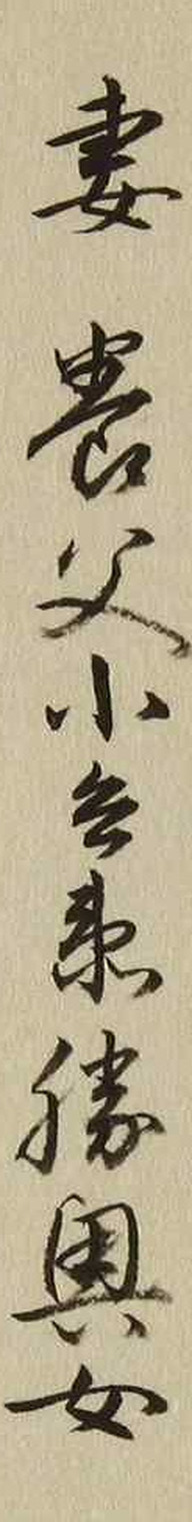妻養父小兵衛勝興女
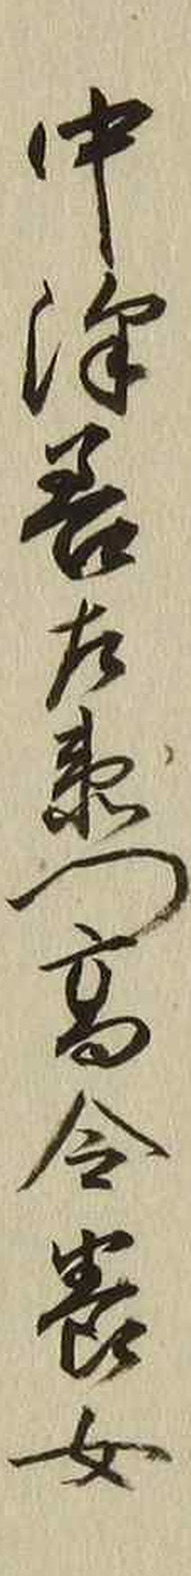中澤善左衛門高令養女
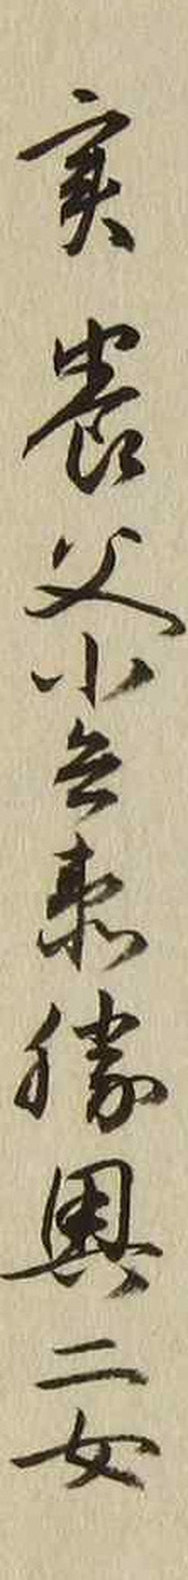実養父小兵衛勝興二女
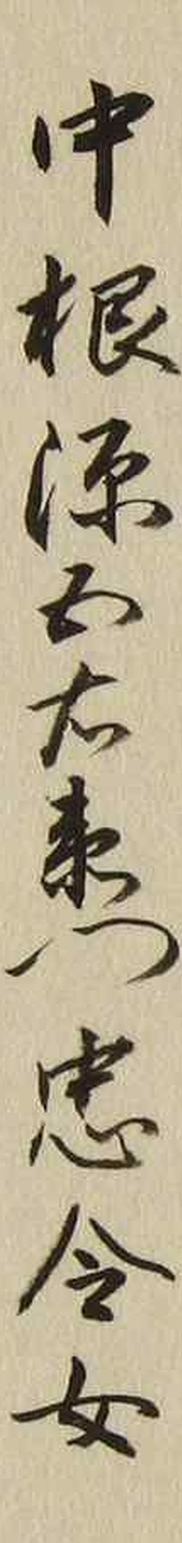中根源五右衛門忠令女
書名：諸士系譜　巻之128　た之部4
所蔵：会津若松市立会津図書館
